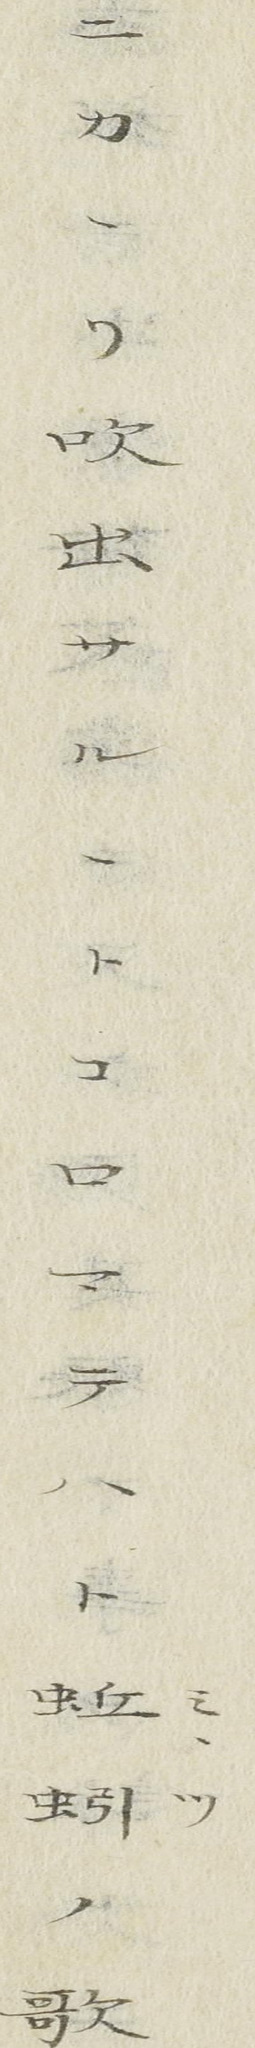ニカヽリ吹出サルヽトコロマテハト蚯蚓ノ歌
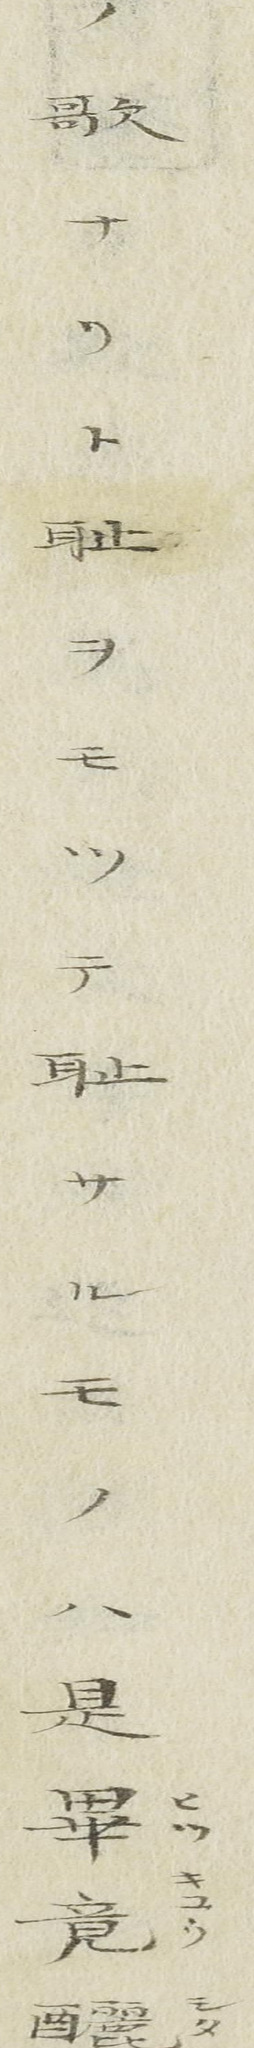ノ歌ナリト恥ヲモツテ恥サルモノハ是畢竟釃
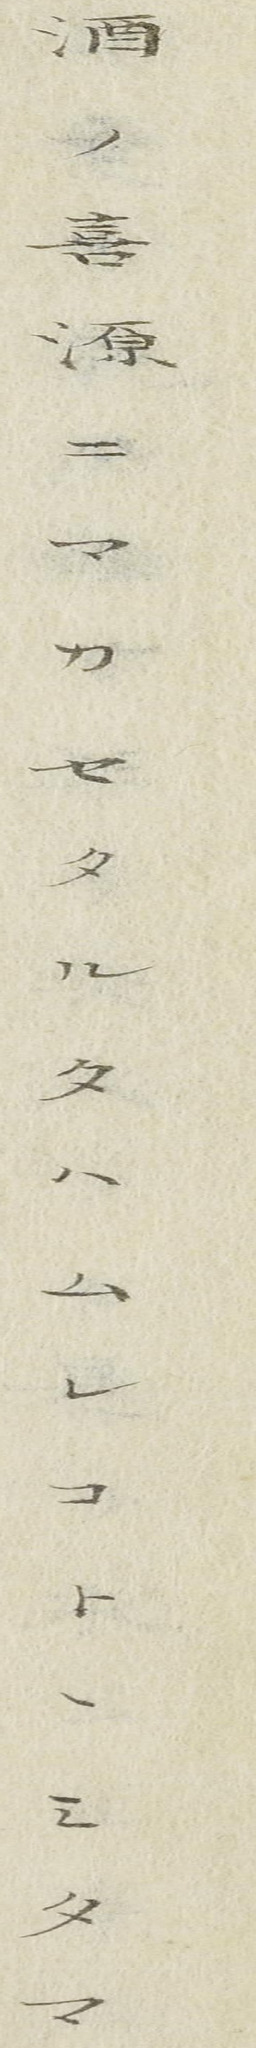酒ノ喜源ニマカセタルタハムレコトヽミタマ

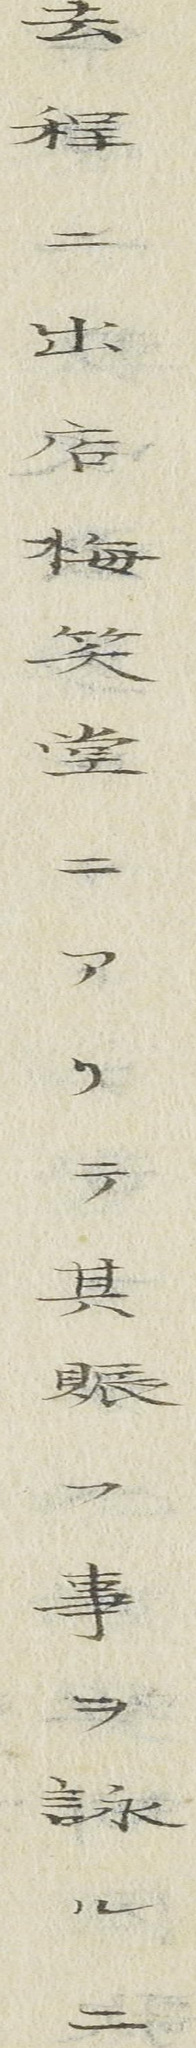去程ニ出店梅笑堂ニアリテ其賑フ事ヲ詠ルニ
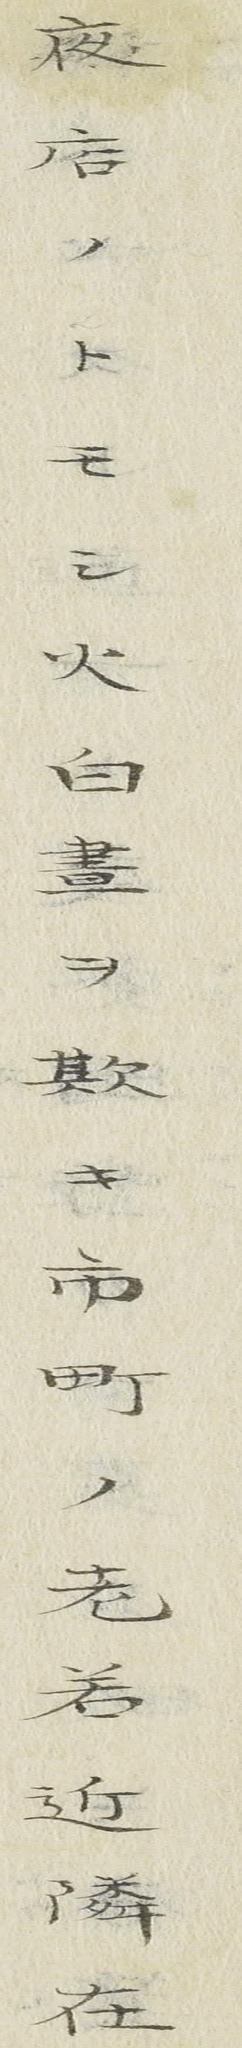夜店ノトモシ火白昼ヲ欺キ市町ノ老若近隣在
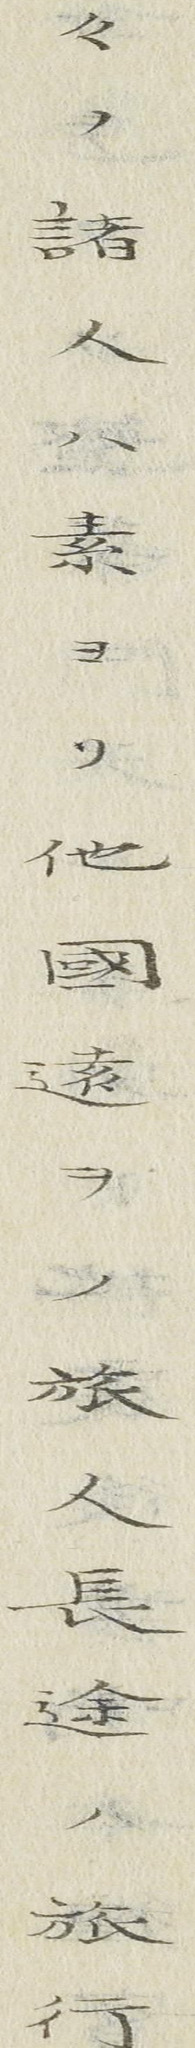々ノ諸人ハ素ヨリ他国遠ヲノ旅人長途ノ旅行
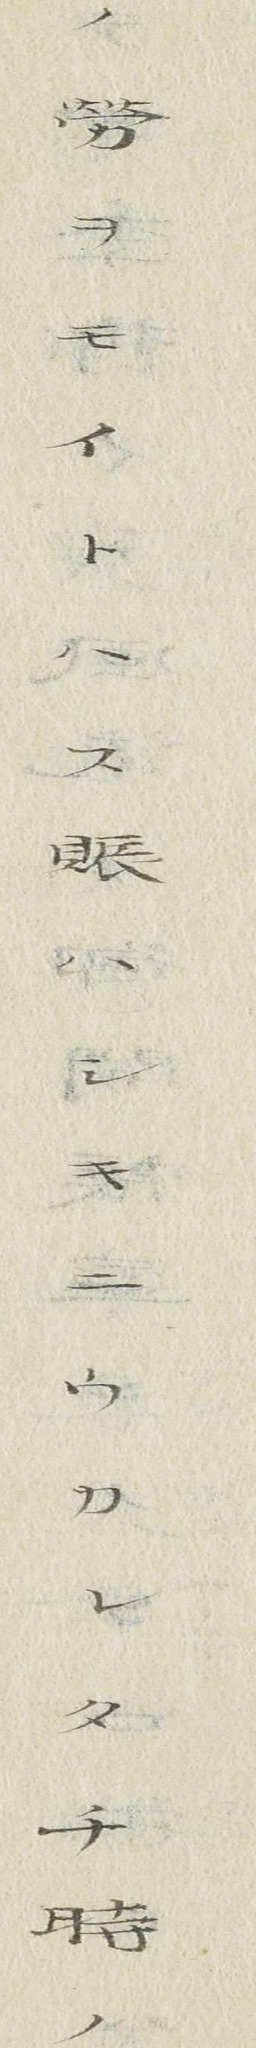ノ労ヲモイトハス賑ハシキニウカレタチ時ノ
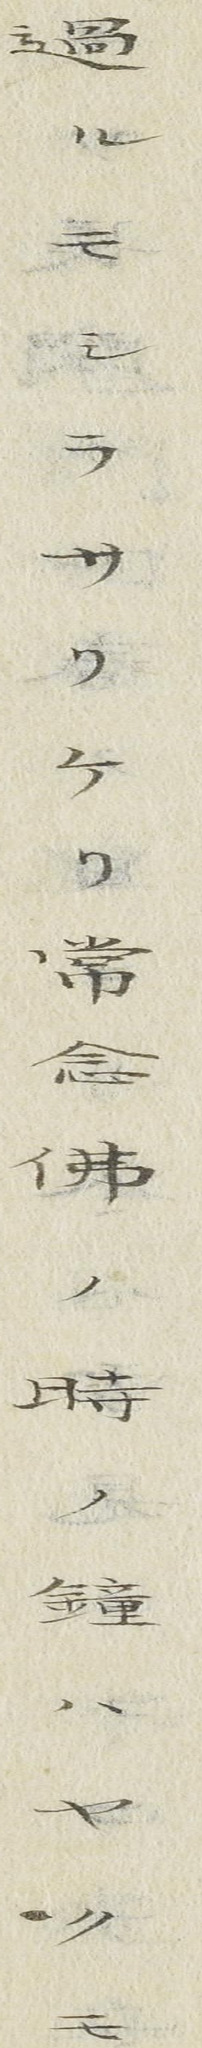過ルモシラサリケリ常念仏ノ時ノ鐘ハヤクモ
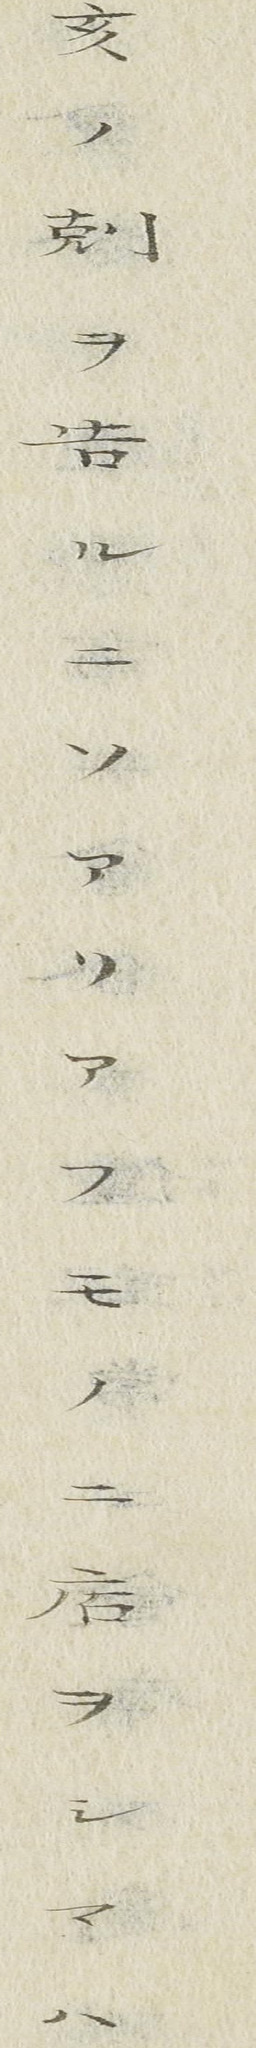亥ノ刻ヲ告ルニソアリアフモノニ店ヲシマハ
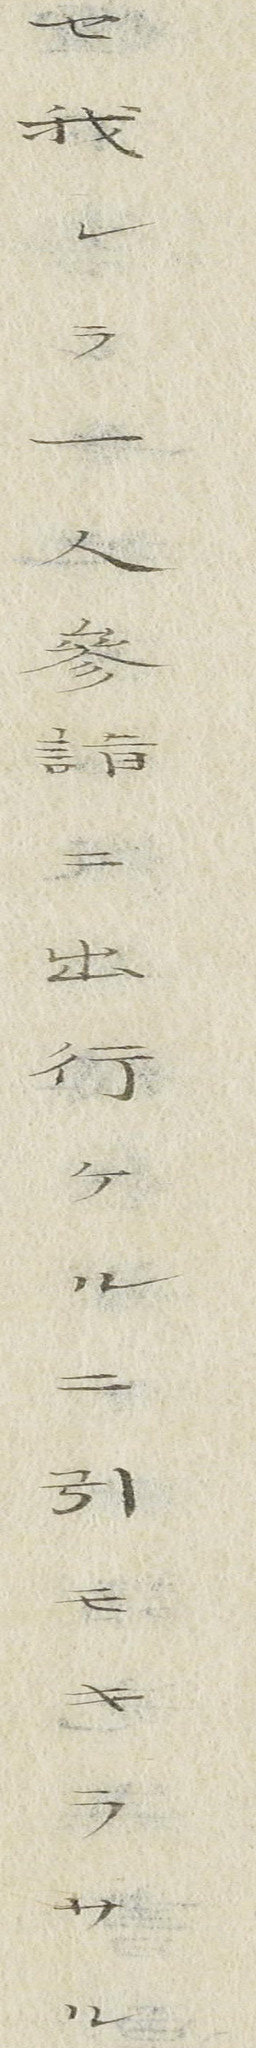セ我レラ一人参詣ニ出行ケルニ引モキラサル
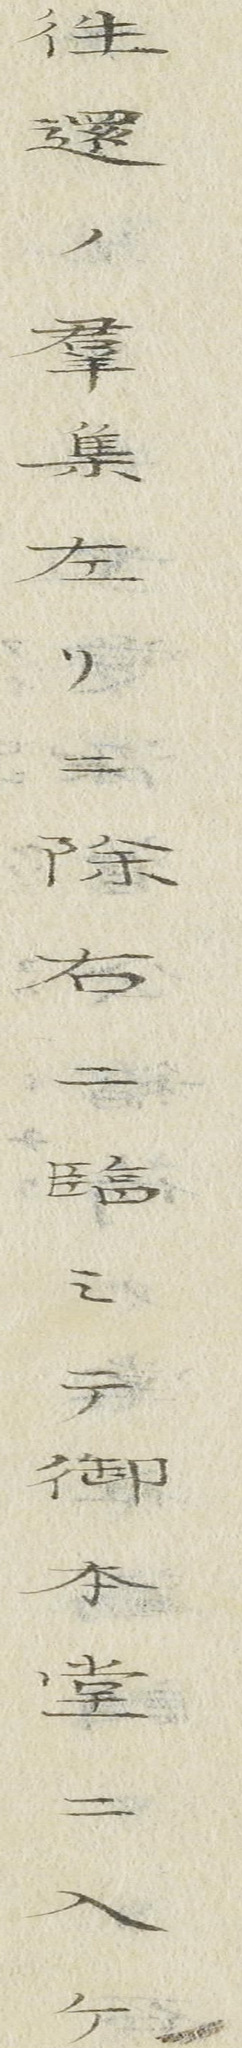往還ノ群集左リニ除右ニ臨ミテ御本堂ニ入ケ
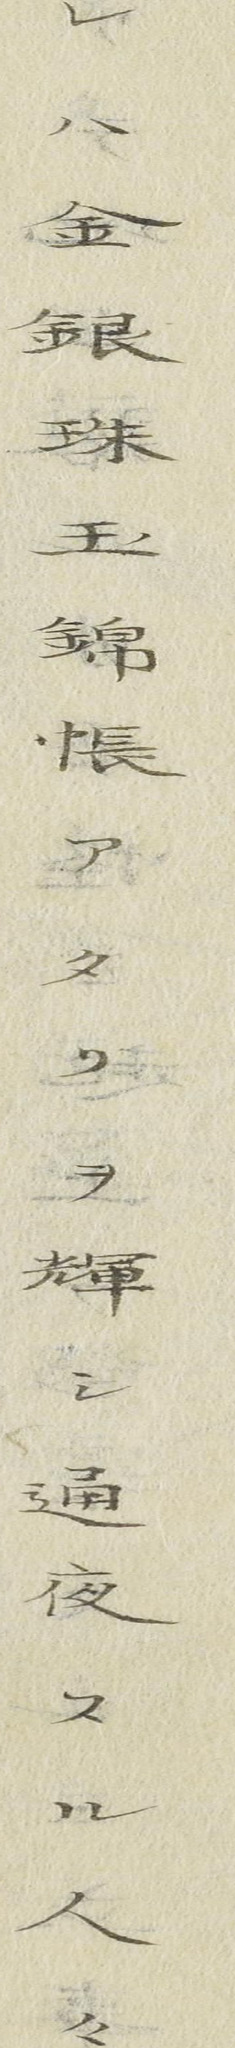レハ金銀珠玉錦帳アタリヲ輝シ通夜スル人々
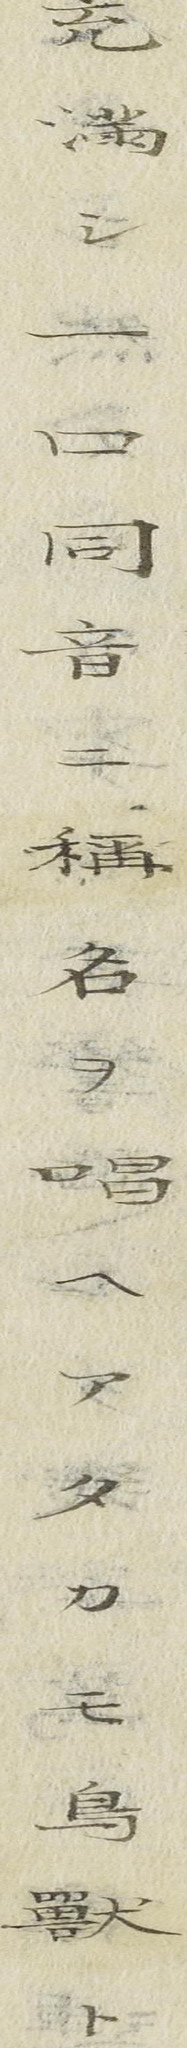充満シ一口同音ニ称名ヲ唱ヘアタカモ鳥獣ト
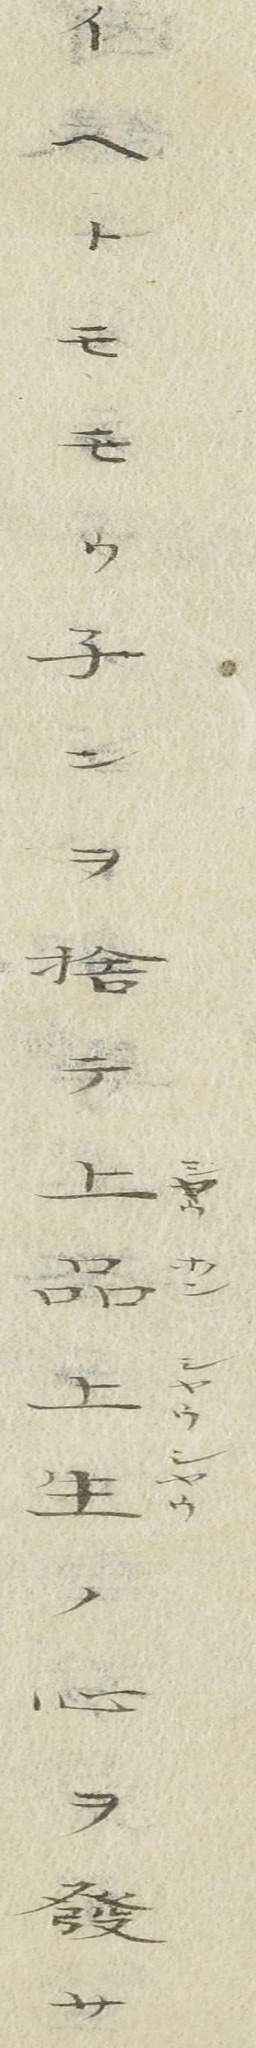イヘトモモウ子ンヲ捨テ上品上生ノ心ヲ発サ
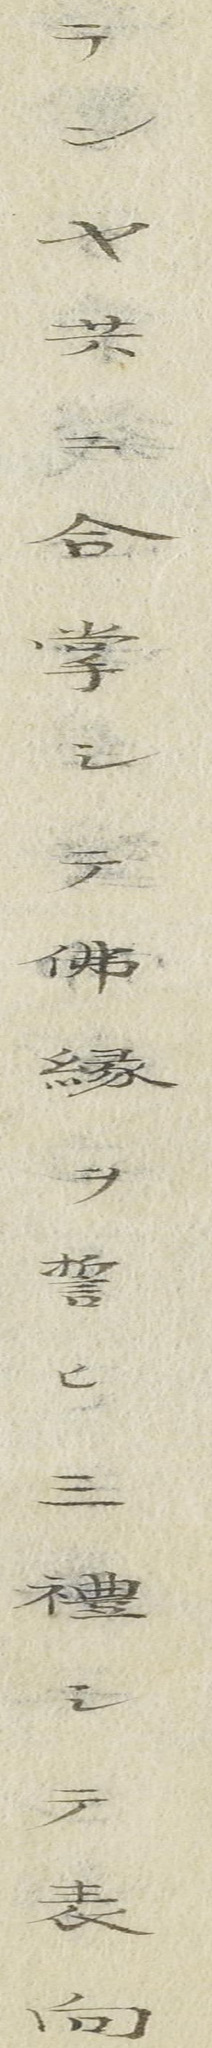ランヤ共ニ合掌シテ仏縁ヲ誓ヒ三礼シテ表向
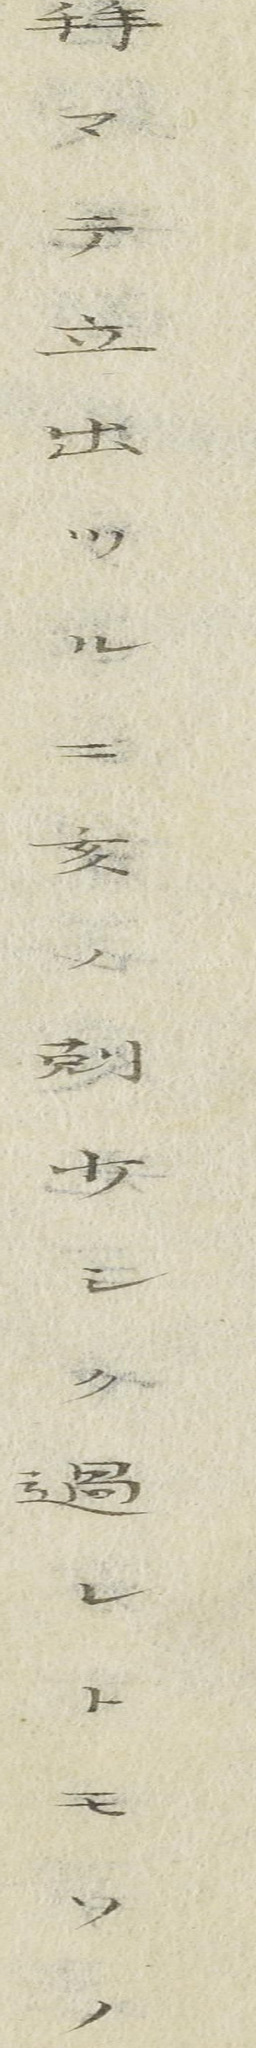拝マテ立出ツルニ亥ノ刻少シク過レトモソノ
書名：地災撮要　地震之部　巻ノ二
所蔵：東京大学地震研究所図書室 Earthquake Research Institute Library, The University of Tokyo, JAPAN
